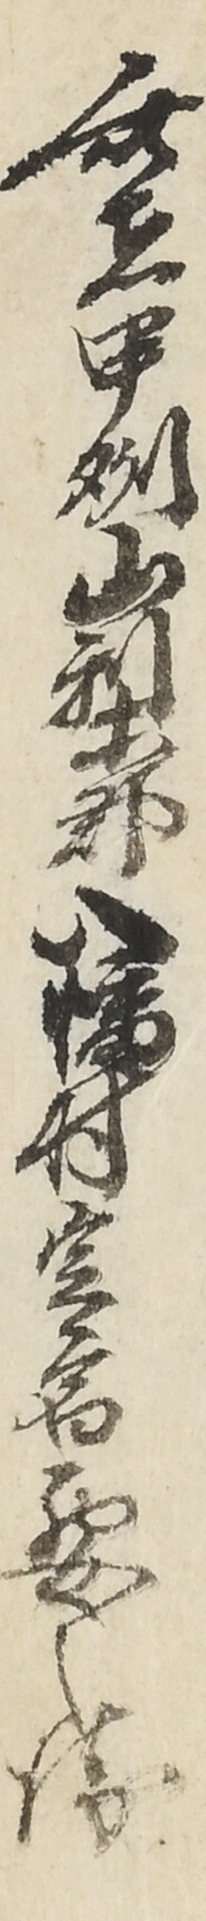此者甲州山梨郡八幡村定宿要兵衛

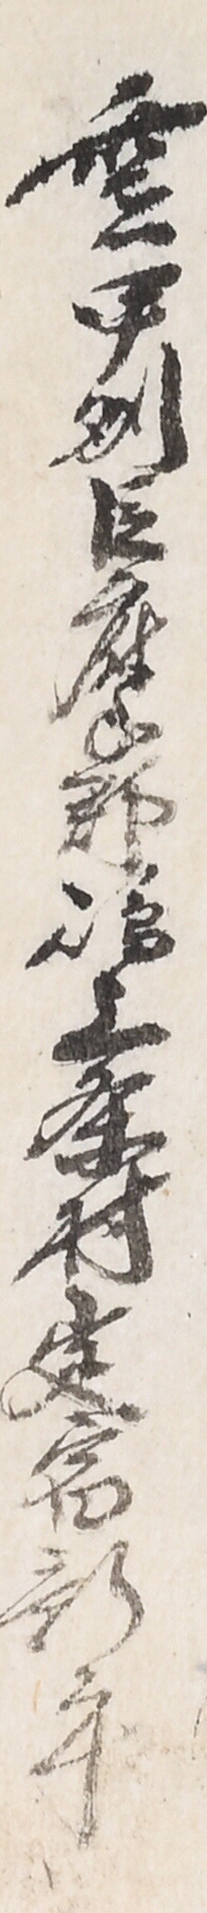此者甲州巨摩郡嶋上条村定宿新平
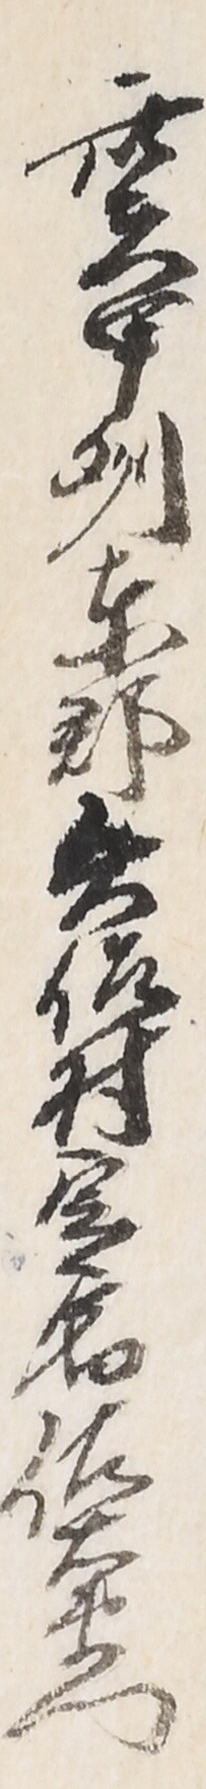此者甲州東郡矢作村定宿作右衛門
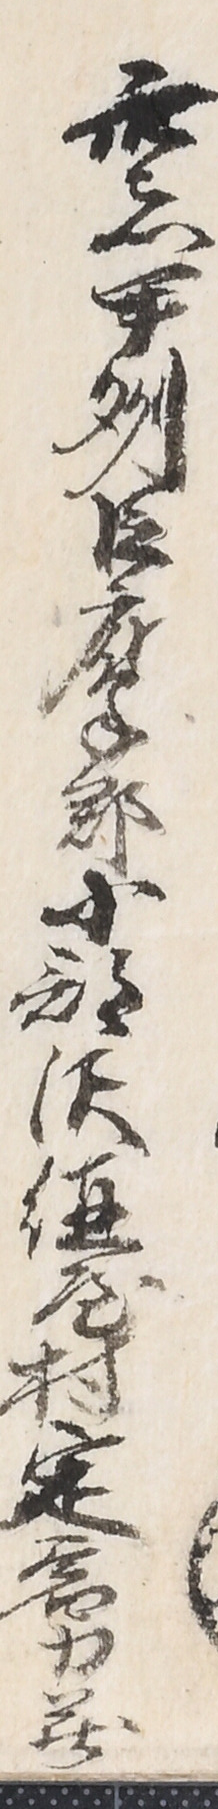此者甲州巨摩郡小部沢徳屋村定宿力蔵
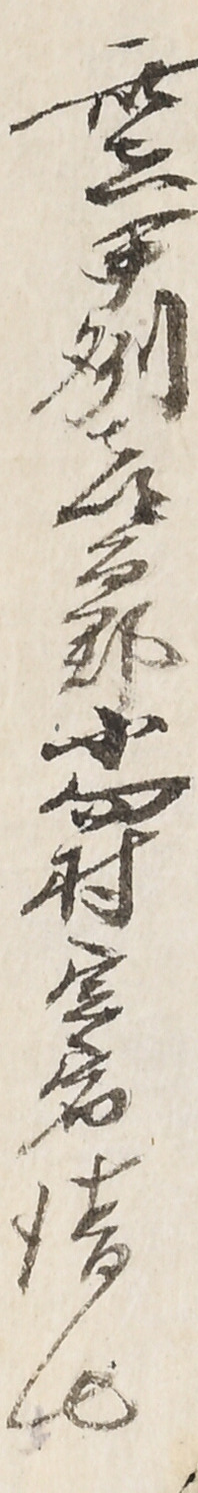此者甲州都留郡小向村定宿清七

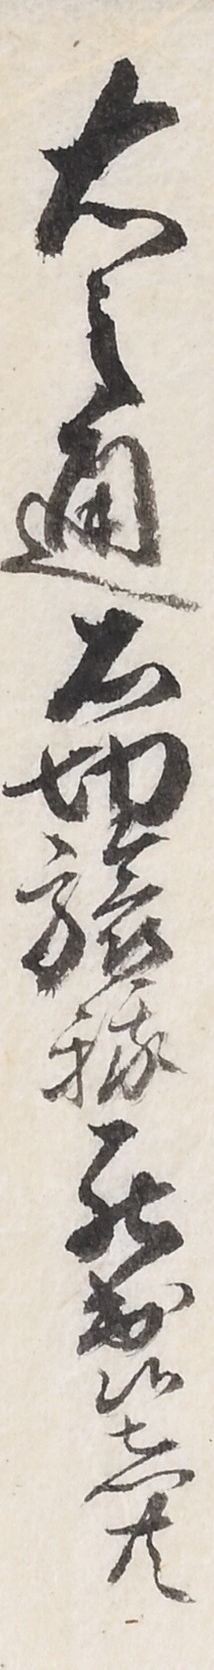右之通石切旅稼罷出候者共
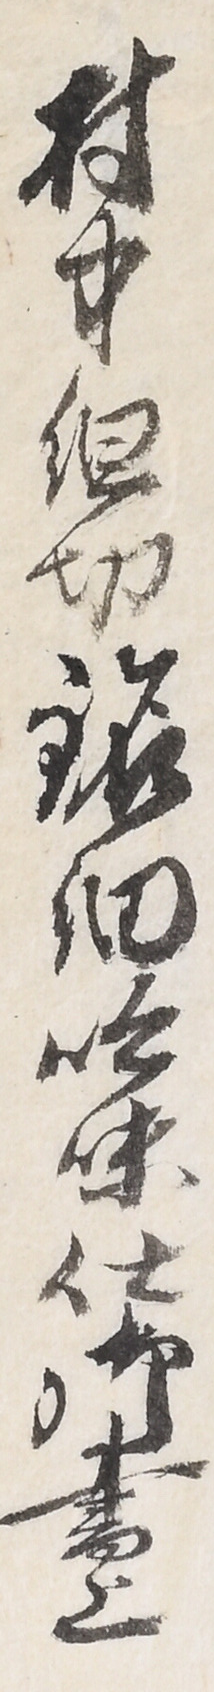村中組切銘細吟味仕御書上
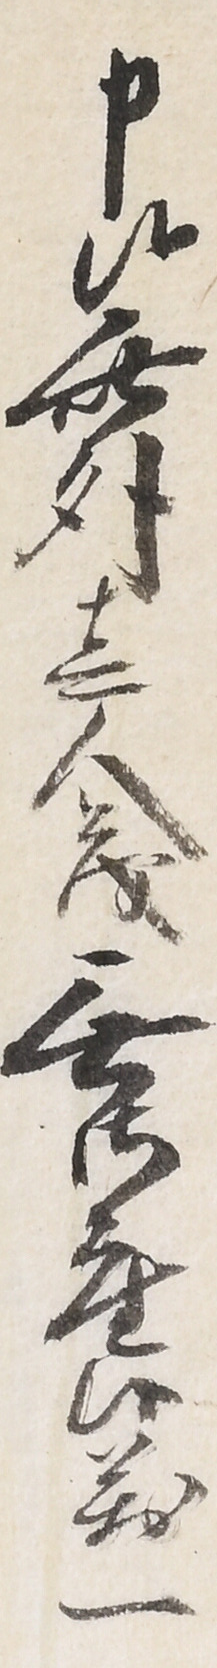申候此外壱人茂無御座候万一
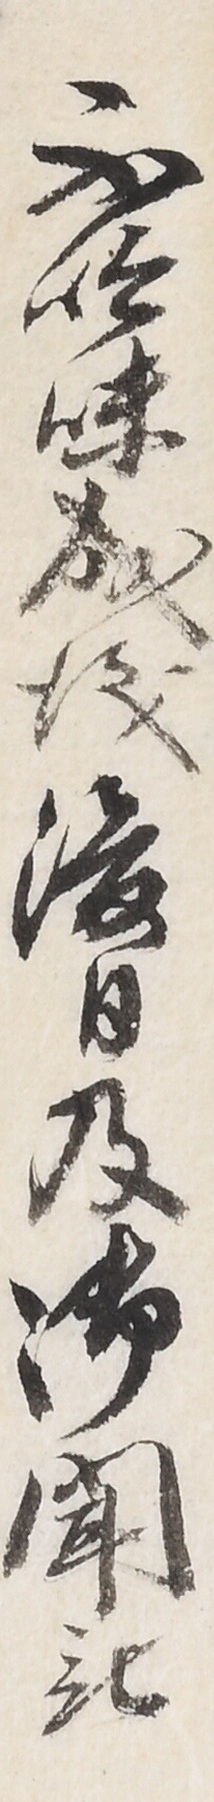不吟味成儀後日及御聞被
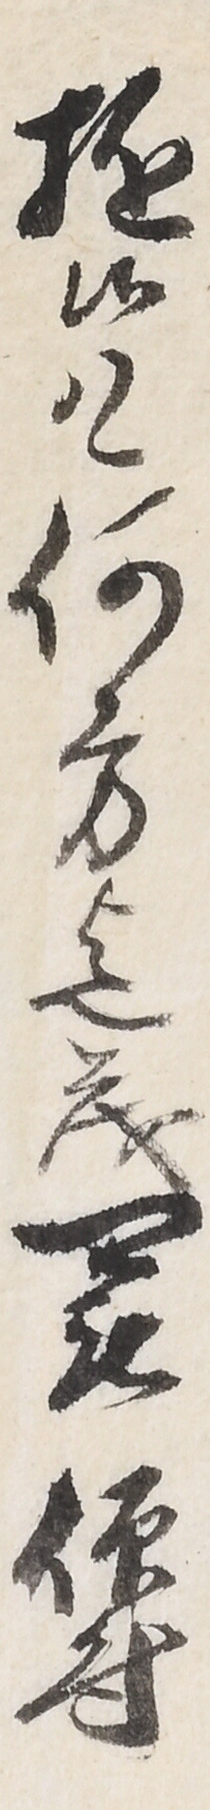遊候ハゝ何方迠茂可被仰付
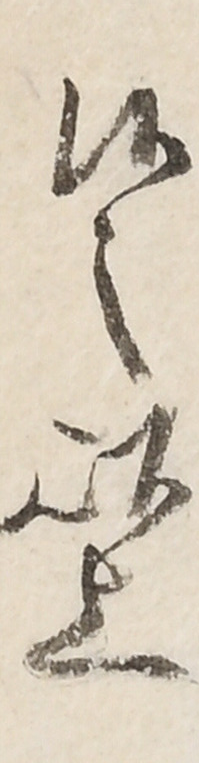候之以上
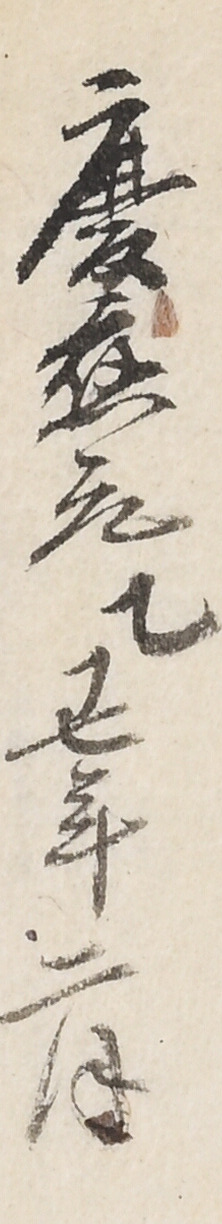慶應元乙丑年二月
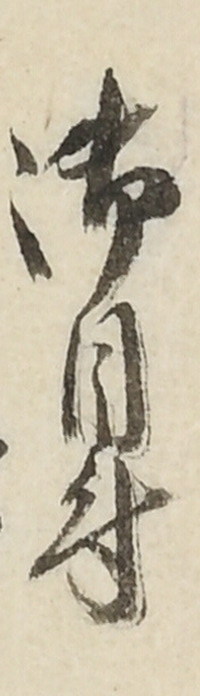御目付
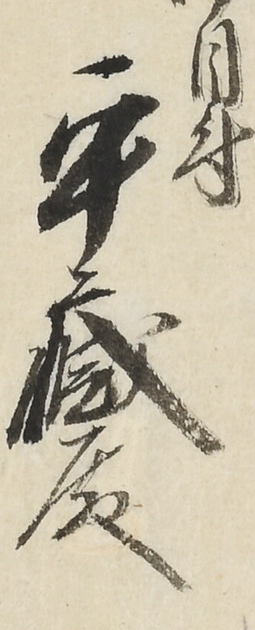平蔵殿
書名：慶應元乙丑年二月他國出石切名前書上帳
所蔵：伊那市立高遠町図書館・合同会社AMANE
